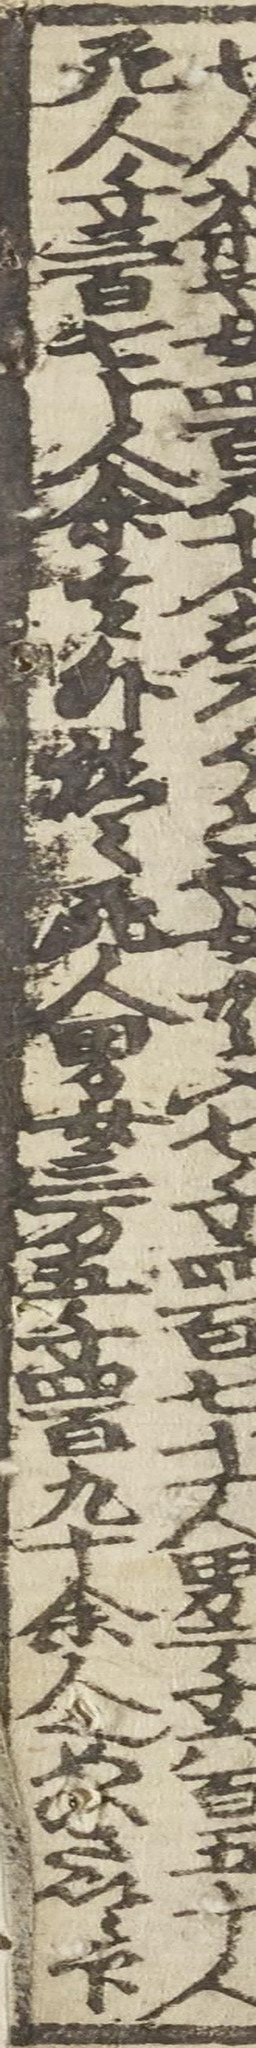死人千三百七十人余其外諸々死人男女三万五千四百九十余人也めいさいに下？
